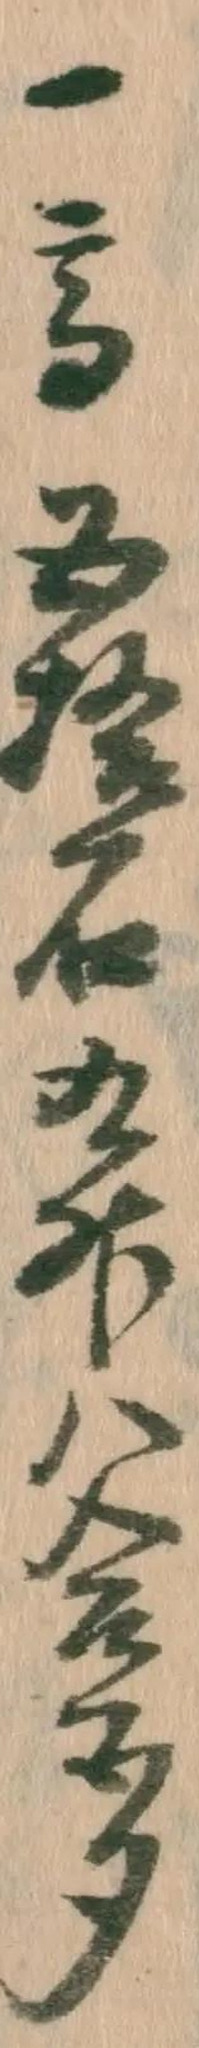一高五拾石九升八合五勺
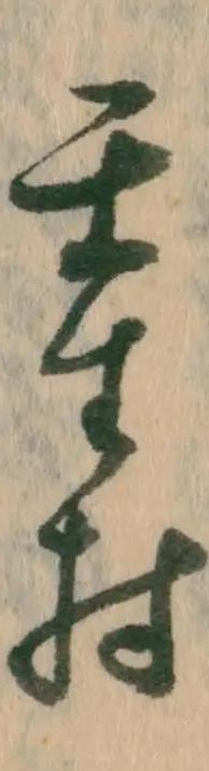壬生村
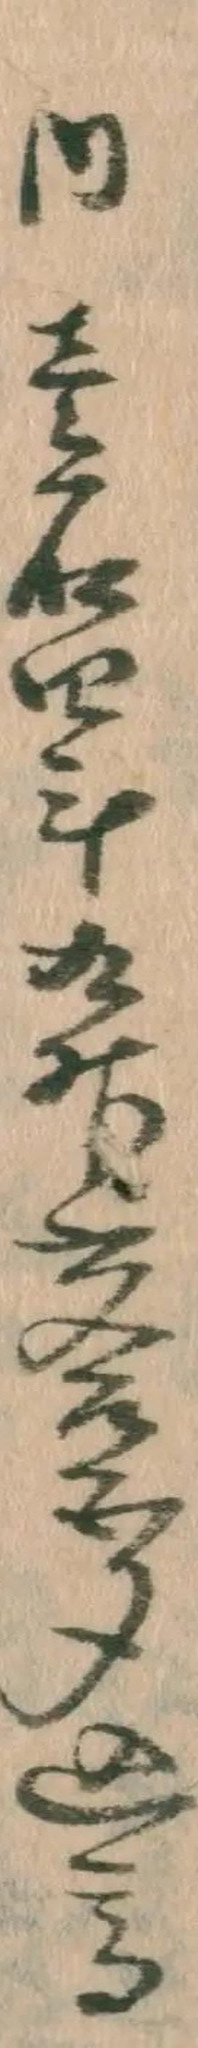内壱石四斗九升六合五勺込高
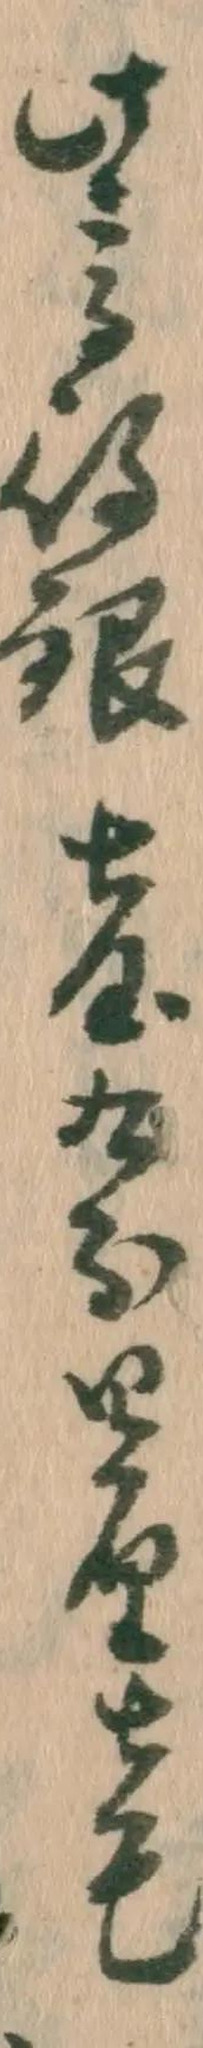此高役銀七匁九分四厘七毛
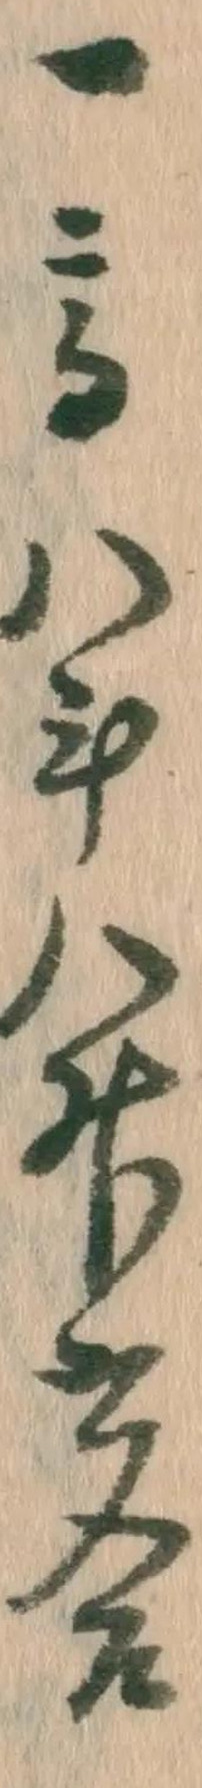一高八斗八升六合
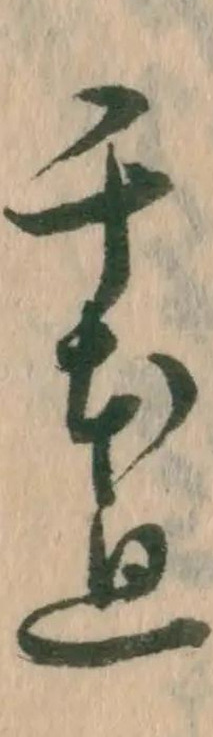千本廻
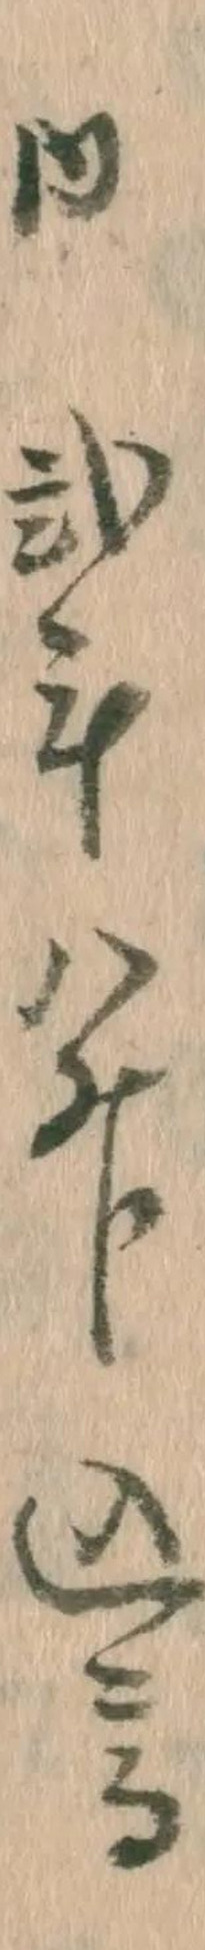内弐斗八升込高
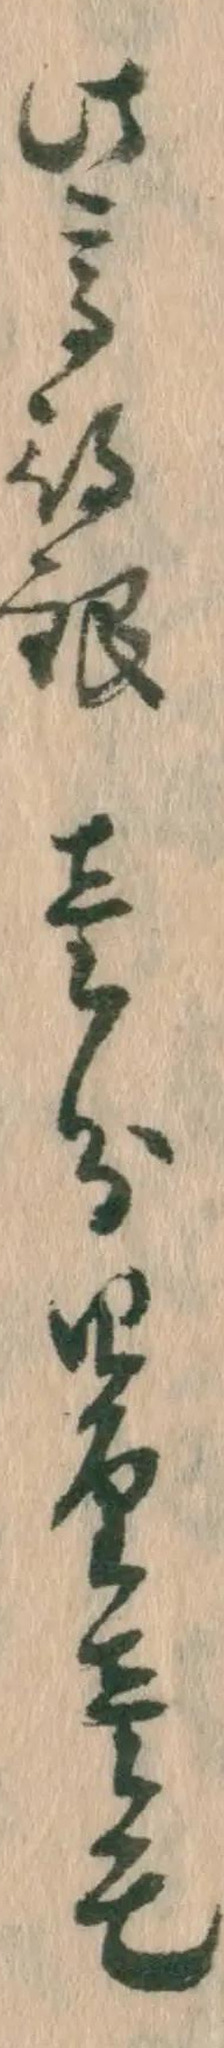此高役銀壱分四厘壱毛
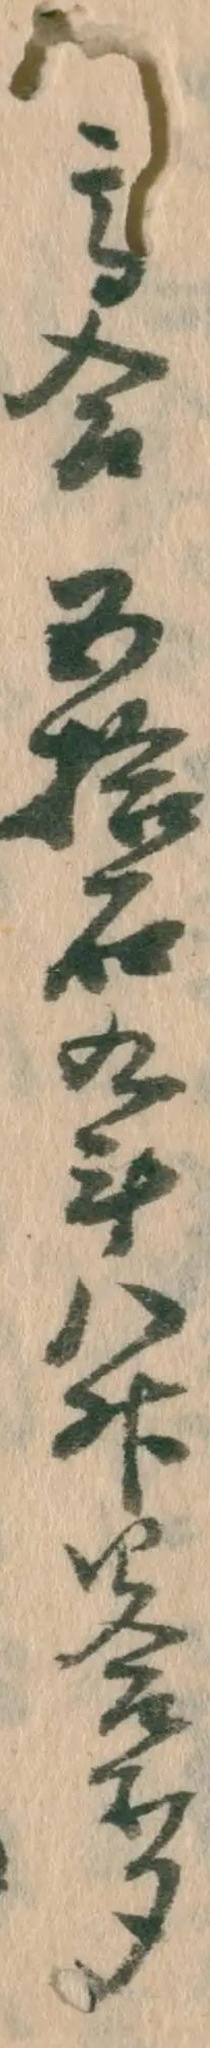高合五拾石九斗八升四合五勺
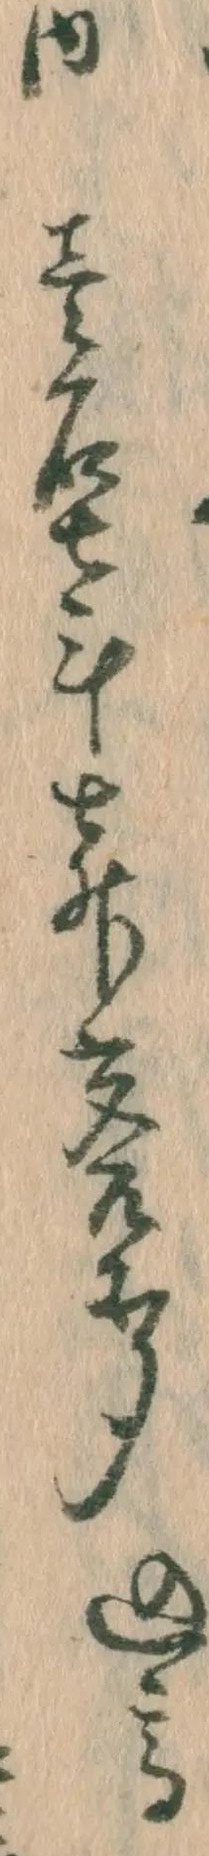内壱石七斗七升六合五勺込高
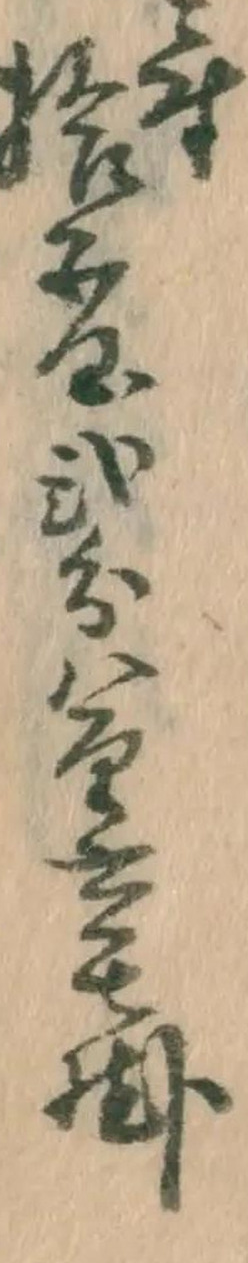拾五匁弐分八厘六毛掛

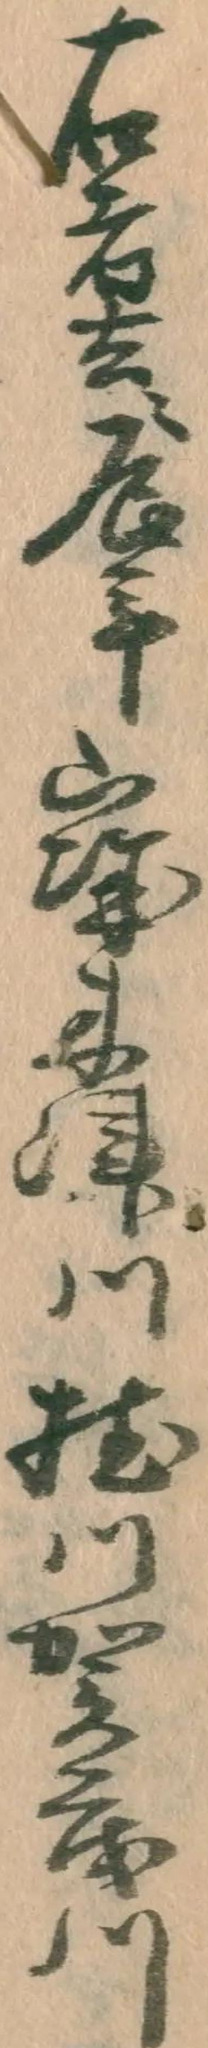右者去々辰年山城来津川桂川賀茂川
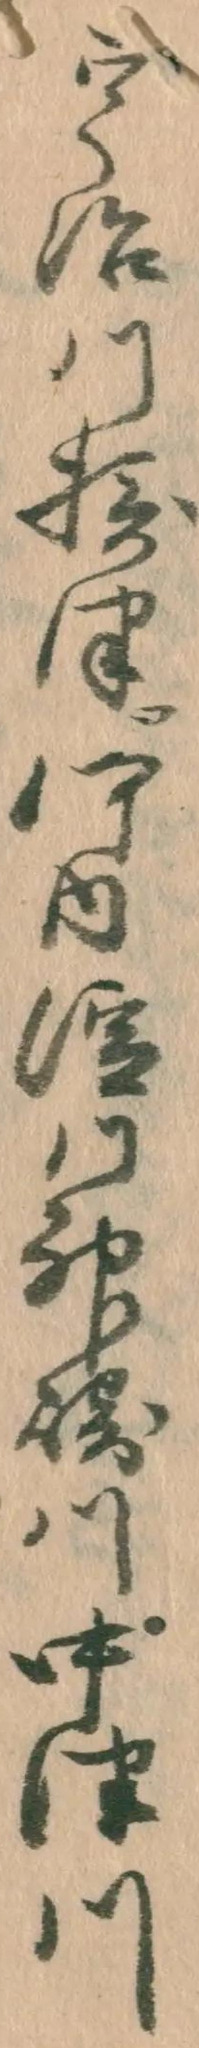宇治川摂津河内淀川神崎川中津川
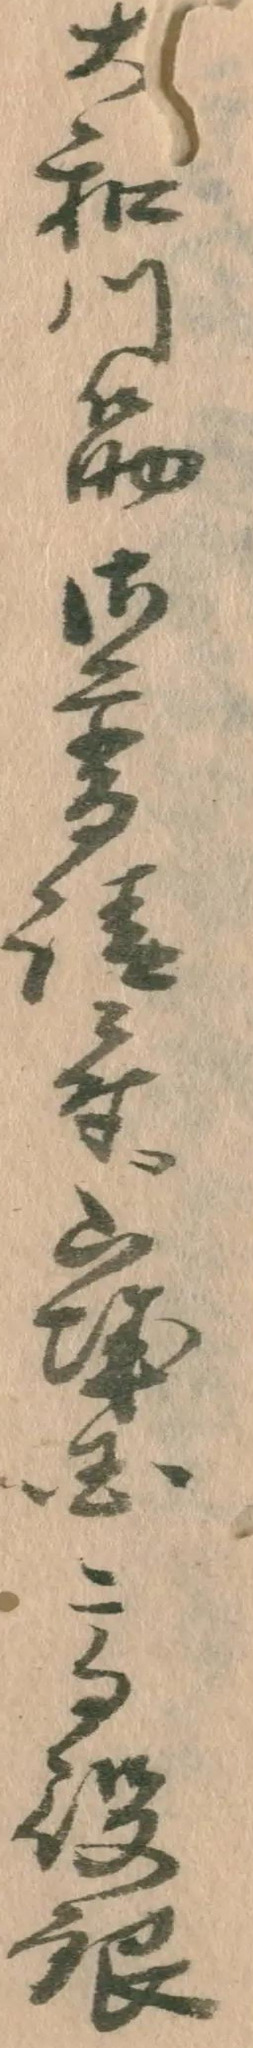大和川筋御普請ニ付山城国高役銀
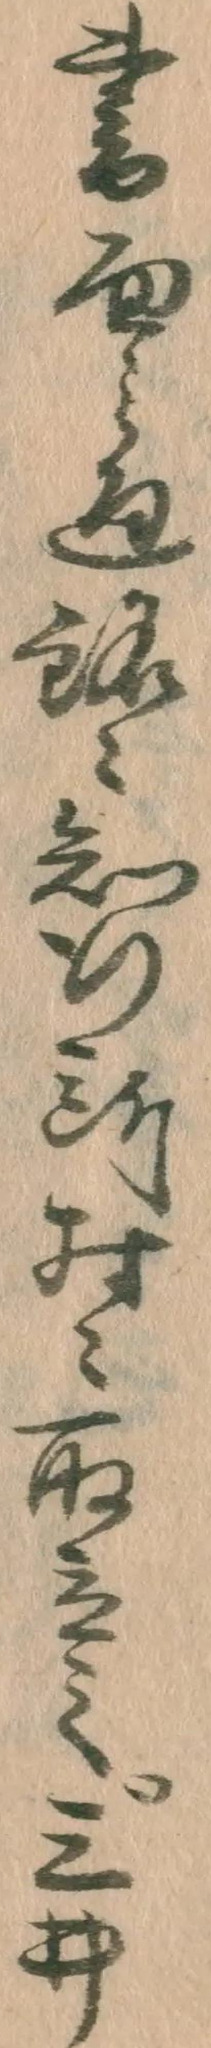書面之通銘々知行所村々取立之三井
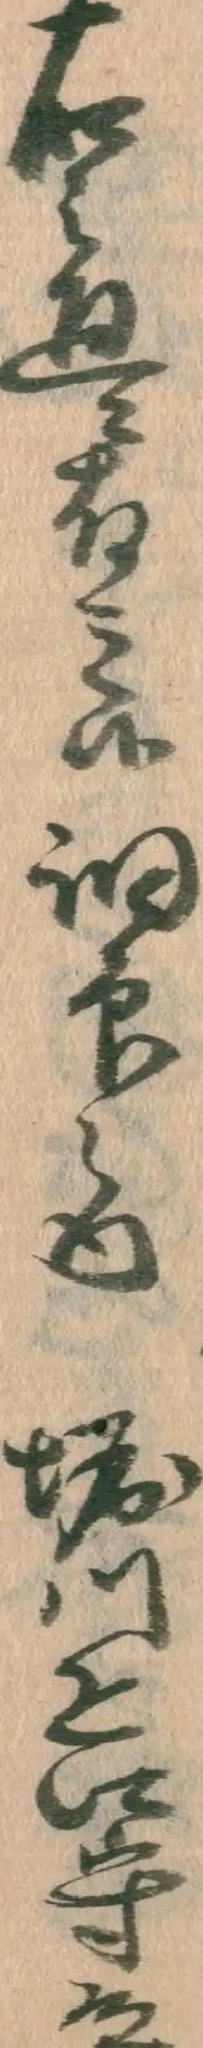右之通ニ有之候調印之内堀川近江守殿
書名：賀茂社記録. 第61冊
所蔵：国立国会図書館 National Diet Library, JAPAN
